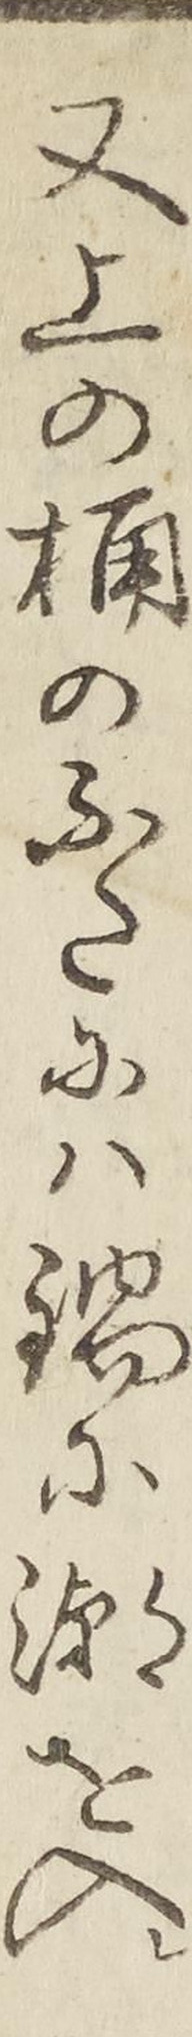又上の桶のふたには鍋に潮を入レ
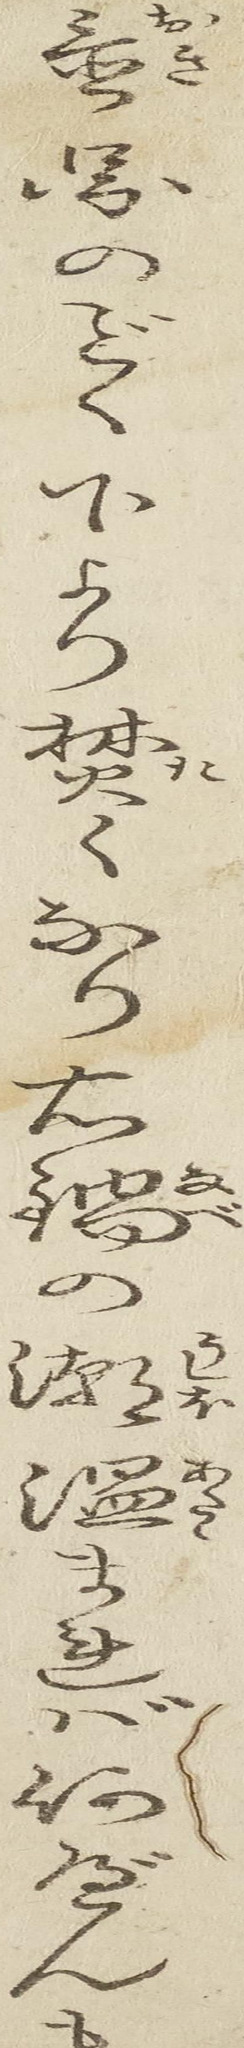置図のごとく下より焚くなり右鍋の潮温まれば何べんも
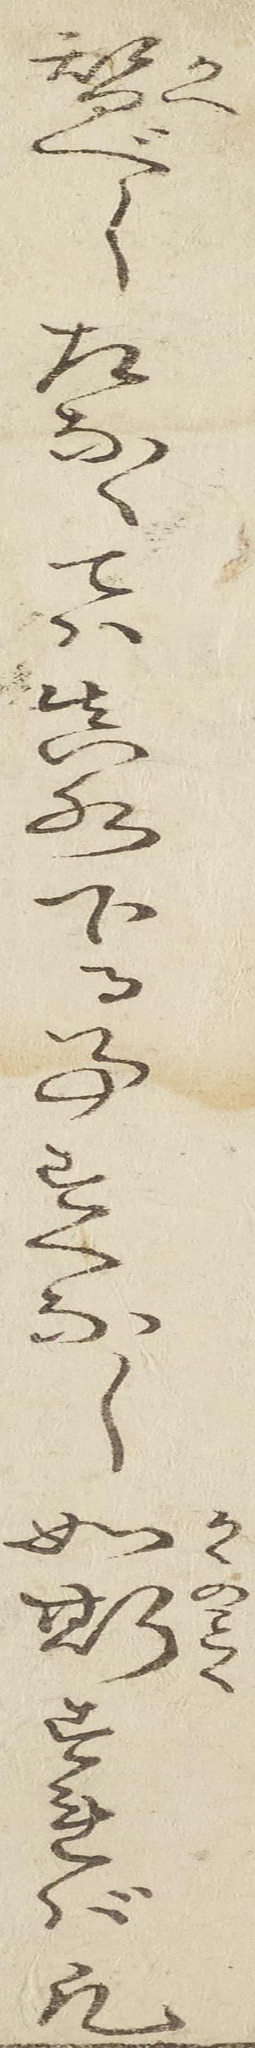替べし左なくては真水下る事すくなし如斯すれば凡
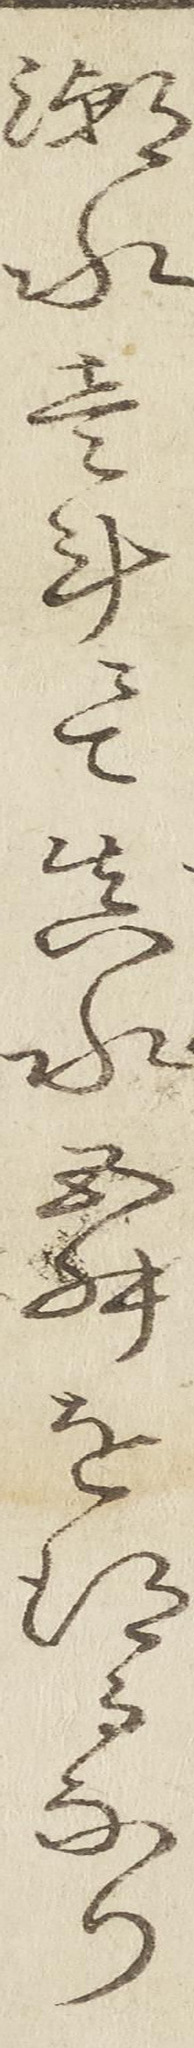潮水一斗ニて真水五升を得るなり
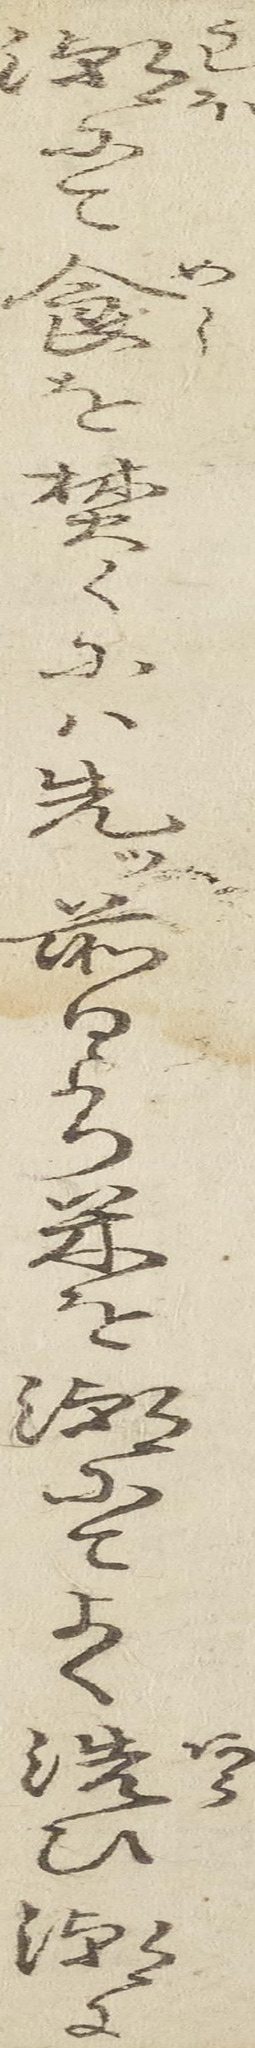潮にて食を焚くには先ツ前日より米を潮にてよく洗ひ潮に
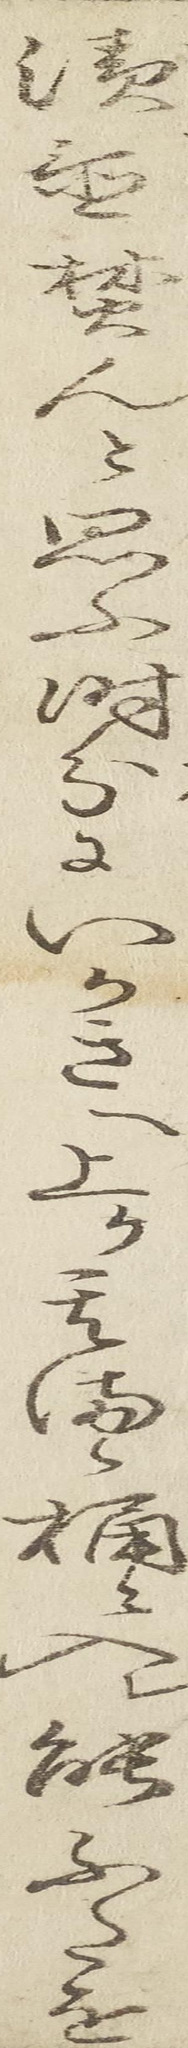漬置焚んと思ふ時分にいかきへ上ケ其まゝ桶ニ入レ能ふたを
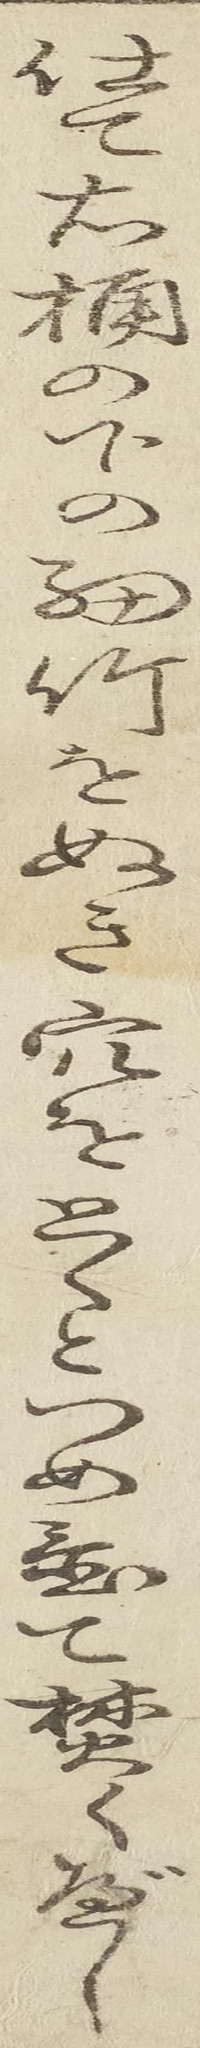仕て右桶の下の細竹をぬき穴をとくとつめ置て焚くべし
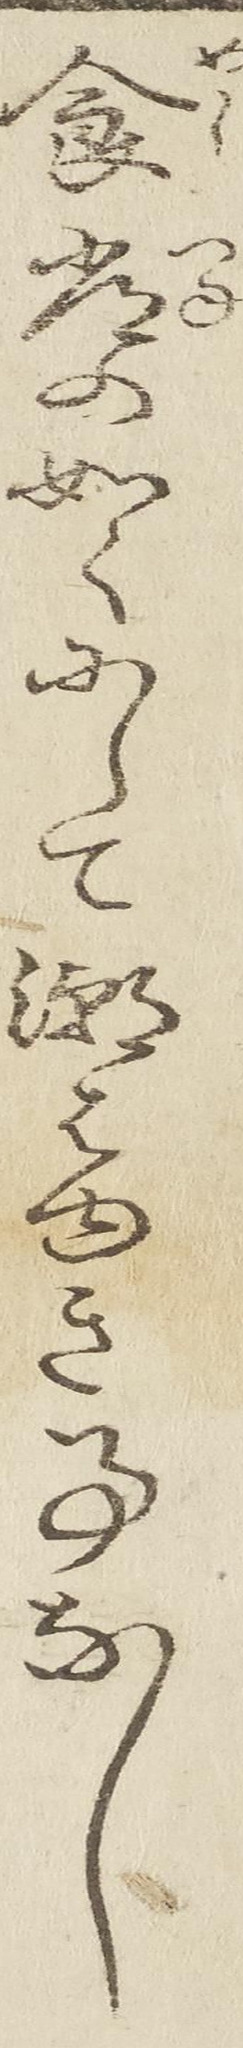食常の如くにして潮はゆき事なし
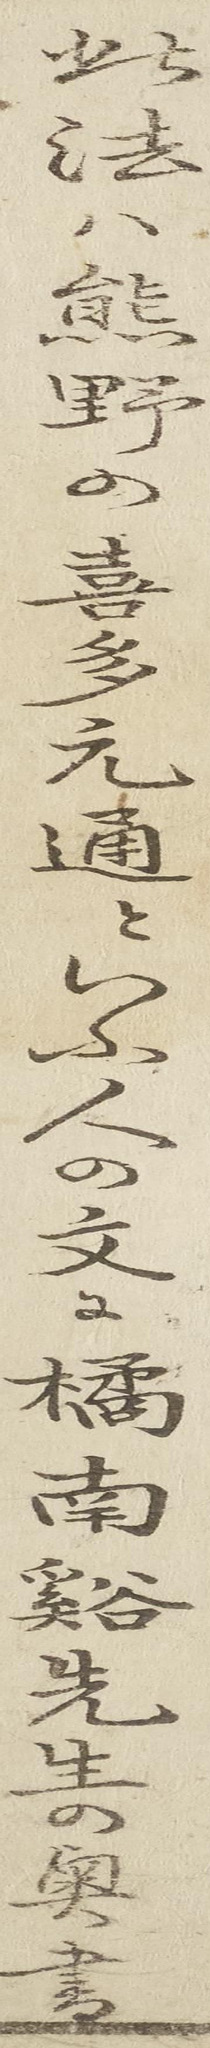此法は熊野の喜多元通といふ人の文に橘南谿先生の奥書
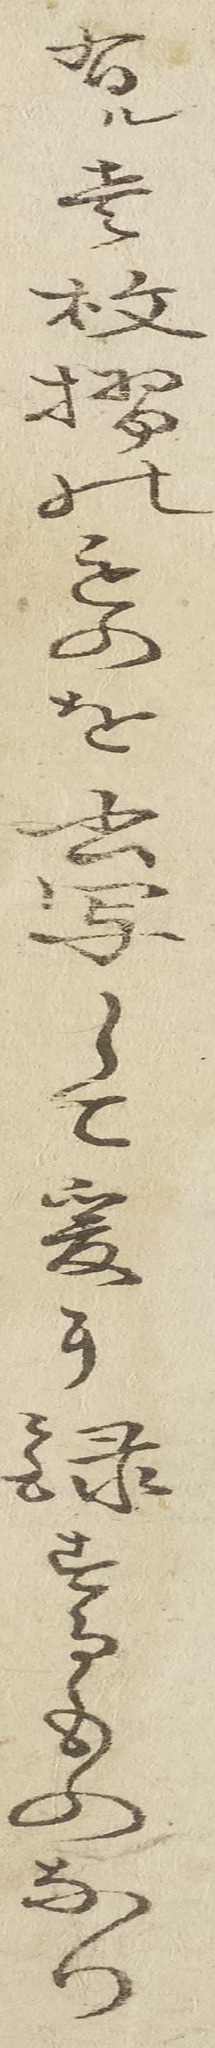有ル壱枚摺のものを書写して爰に録するものなり

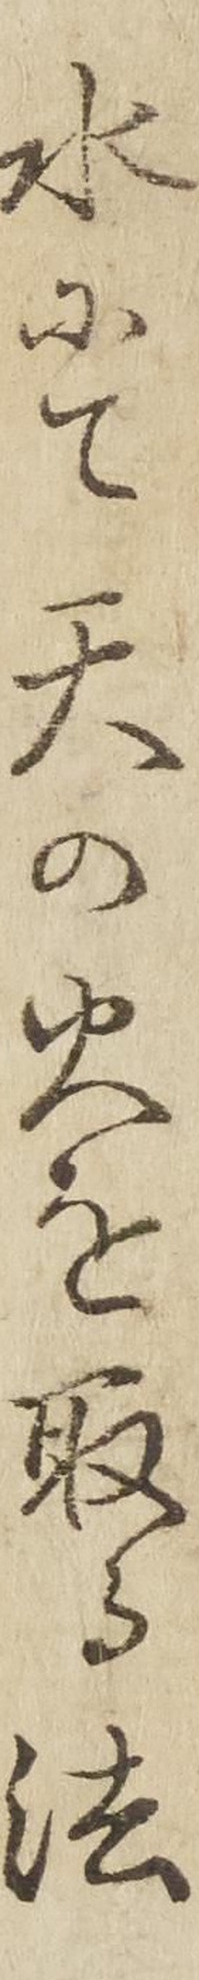水にて天の火を取る法
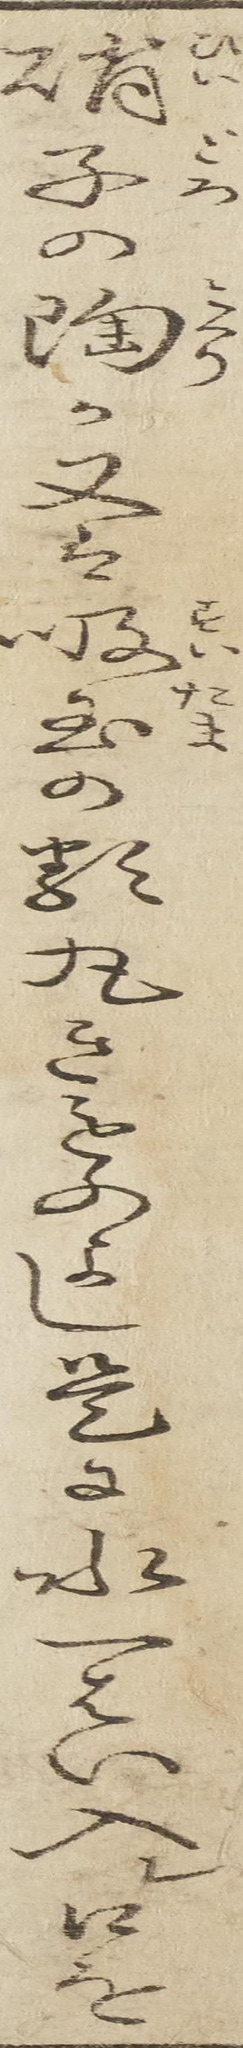硝子の陶か又は吸玉の類丸きものよし是に水一はい入レ口を
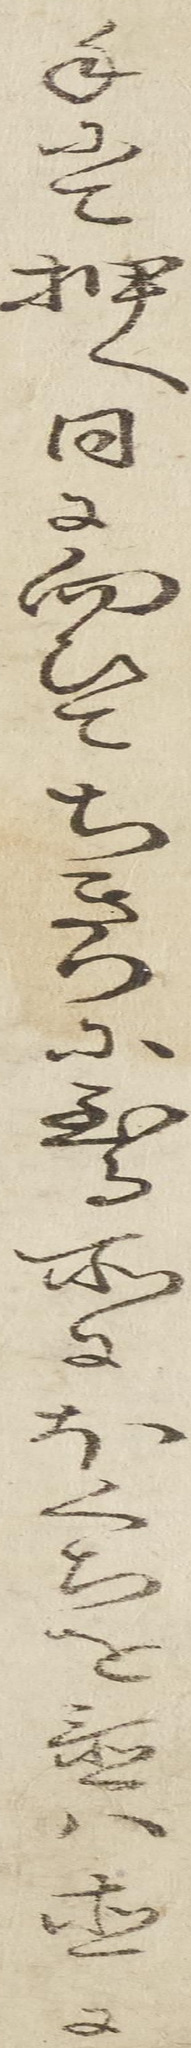手にて押へ日に向ひてちきりに至る所にほくちを置は直に
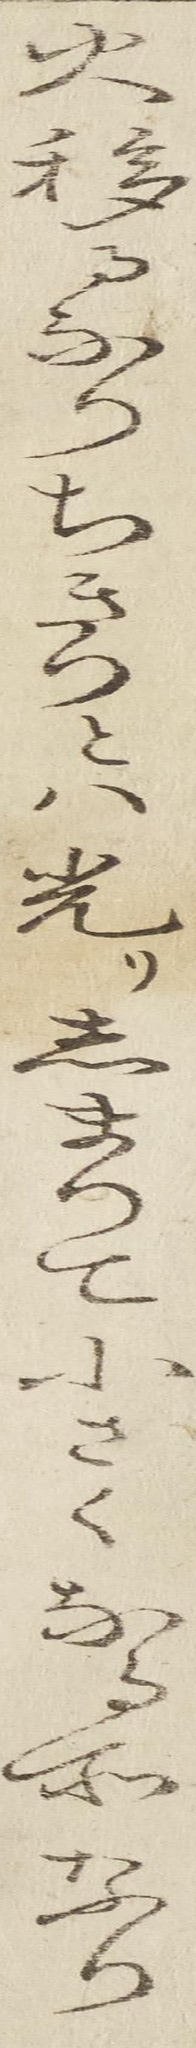火移るなりちきりとは光りしまりて小さくなる所なり
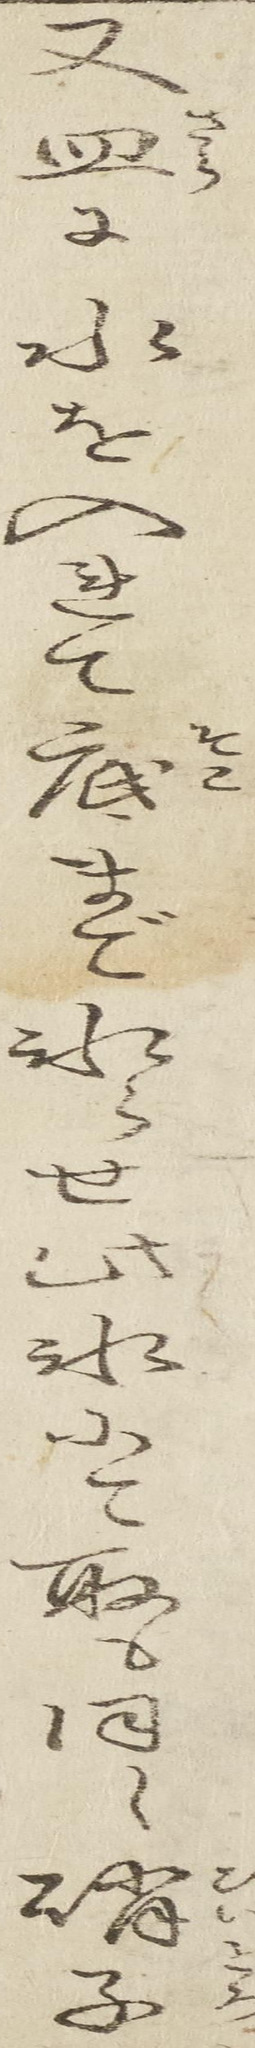又皿に水を入れて底まで氷らせ此氷にて取も同し硝子
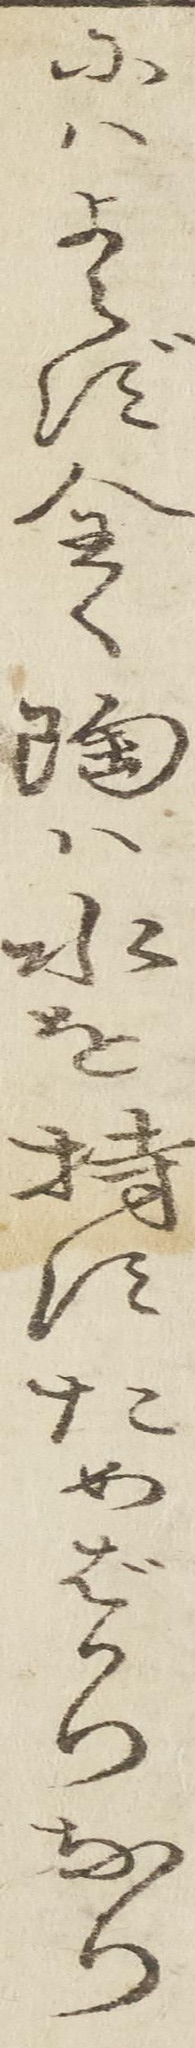にはよらず全く陶は水を持すためばかりなり
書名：平天儀圖解
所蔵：東京大学地震研究所図書室 Earthquake Research Institute Library, The University of Tokyo, JAPAN
